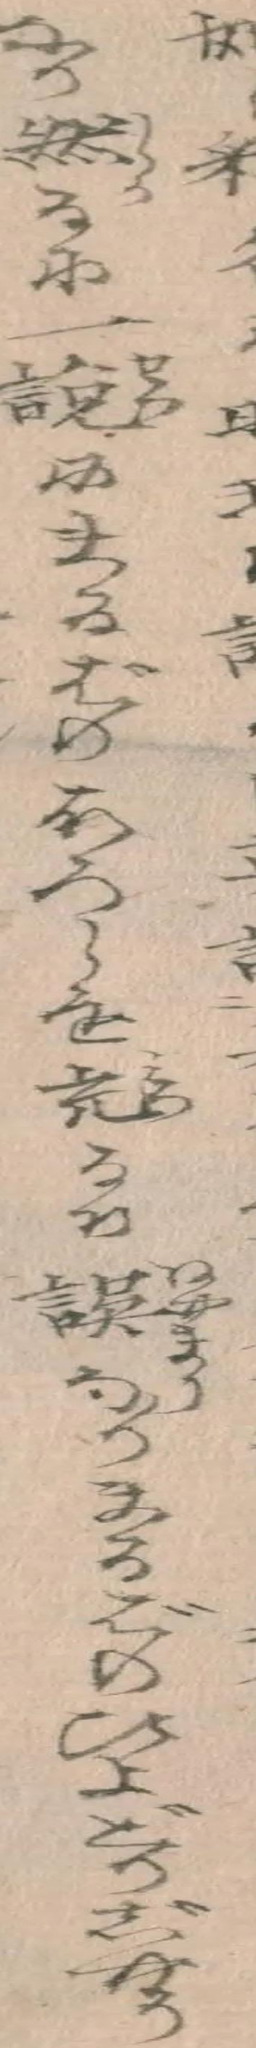なり然るに一説にまるばのほろしを充るは誤なりまるばのひよどりじやう
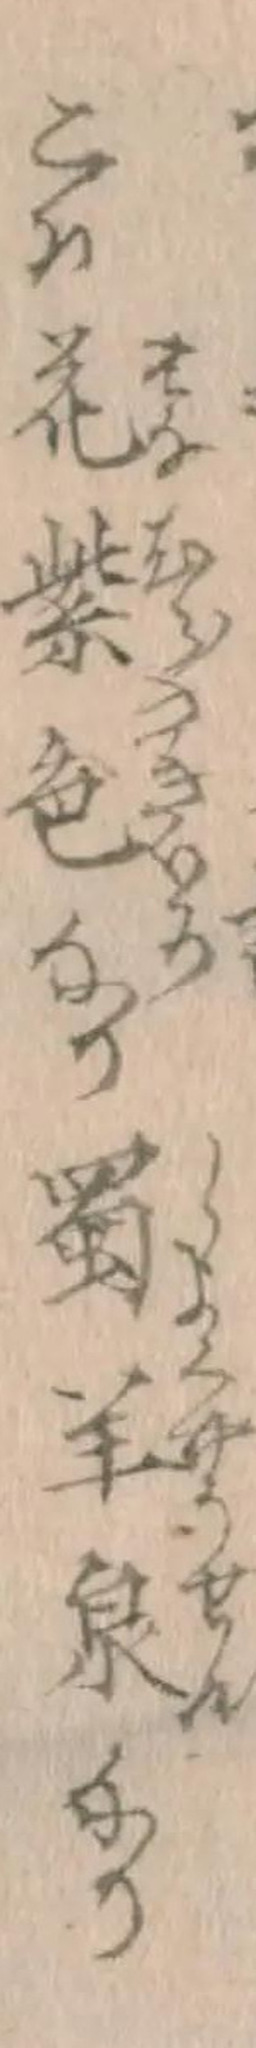こは花紫色なり蜀羊泉なり

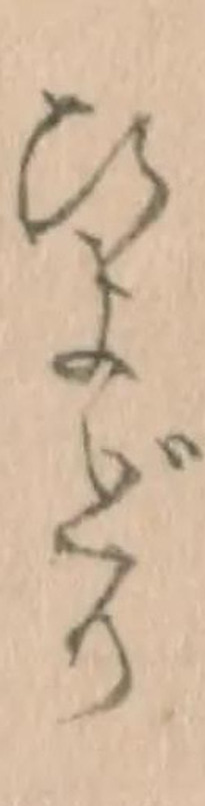ひよどり
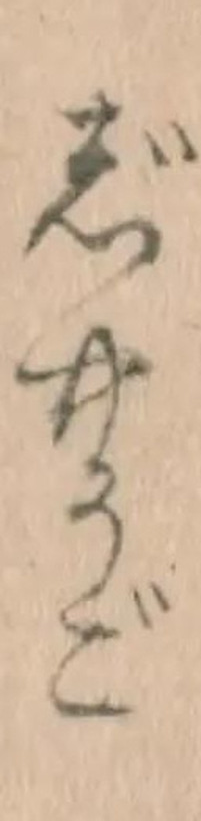じやうご
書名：本草図譜. 巻28-30
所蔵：国立国会図書館 National Diet Library, JAPAN
